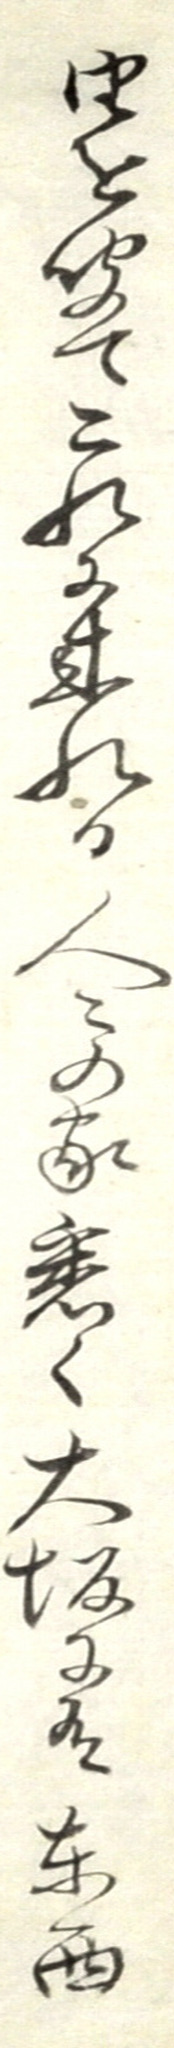由を聞てこれに来れる人々も家悉く大坂には東西
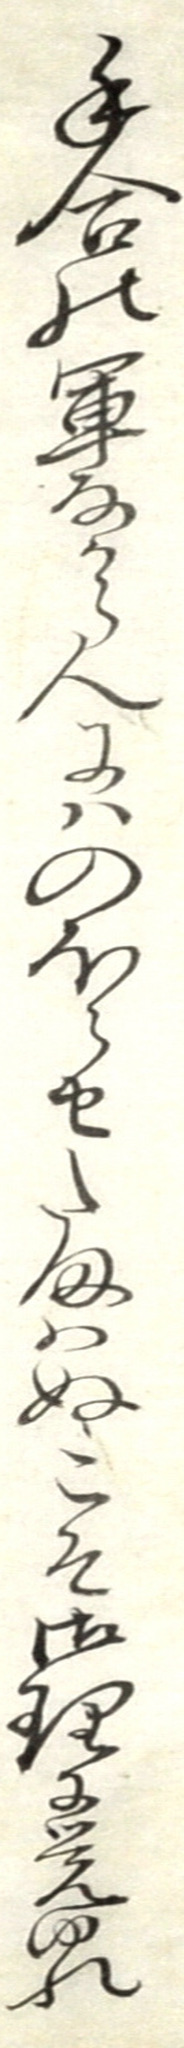手合の軍なからんにはのほらせたまはぬこそ御理に覚ゆれ
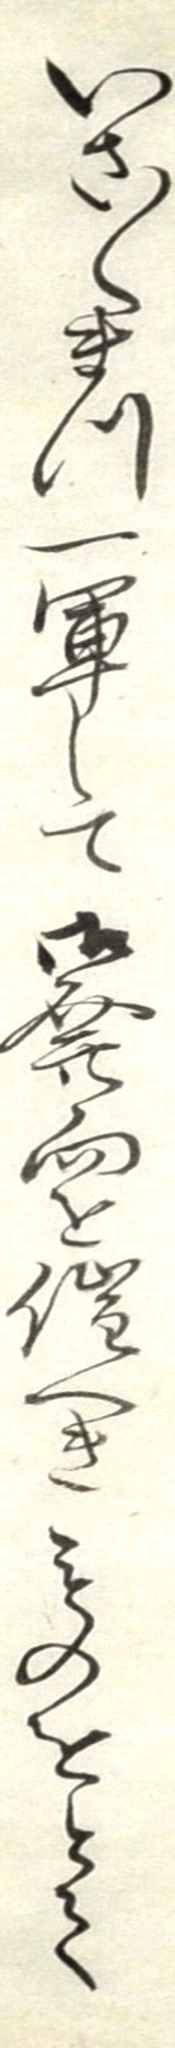いさ〳〵まつ一軍して御発向を催へきものをとて
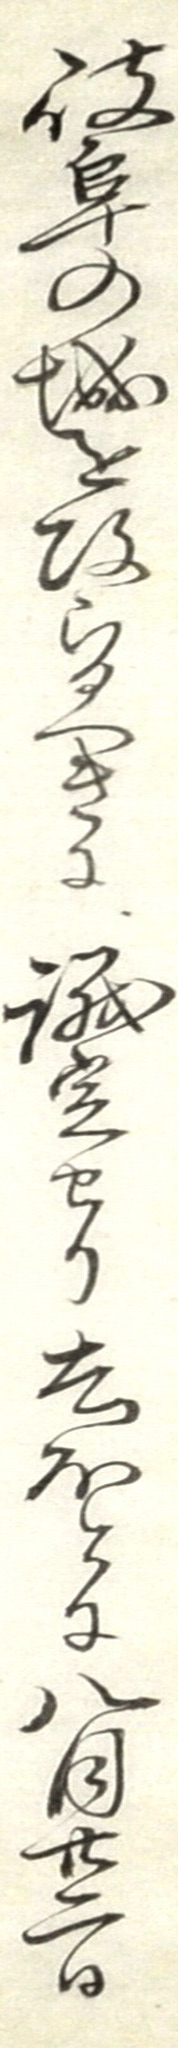岐阜の城を攻らるへきに議定せり去ほとに八月廿二日
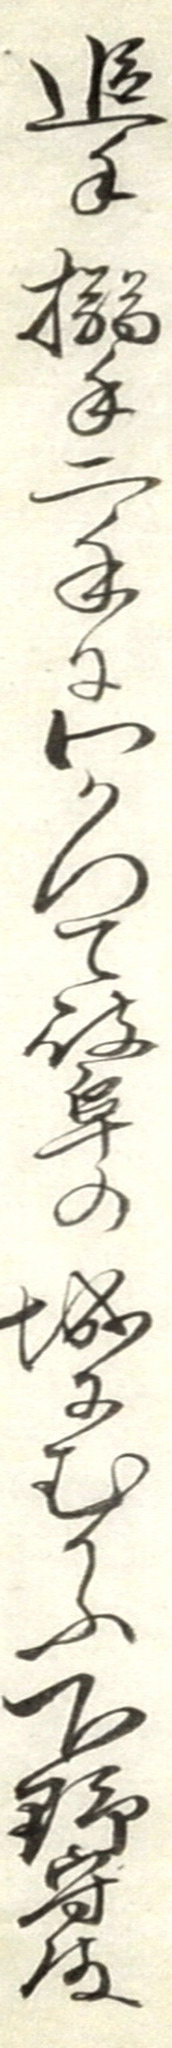追手搦手二手にわかつて岐阜の城にむかふ下野守殿
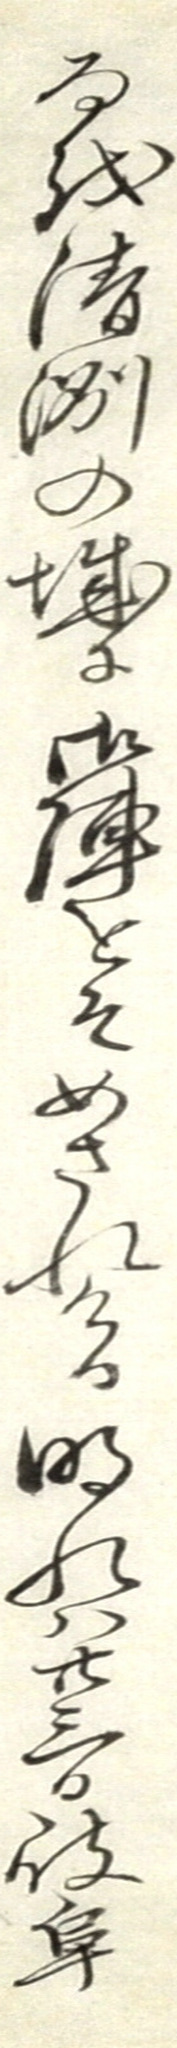なを清洲の城に御陣をそめされける明れは廿三日岐阜
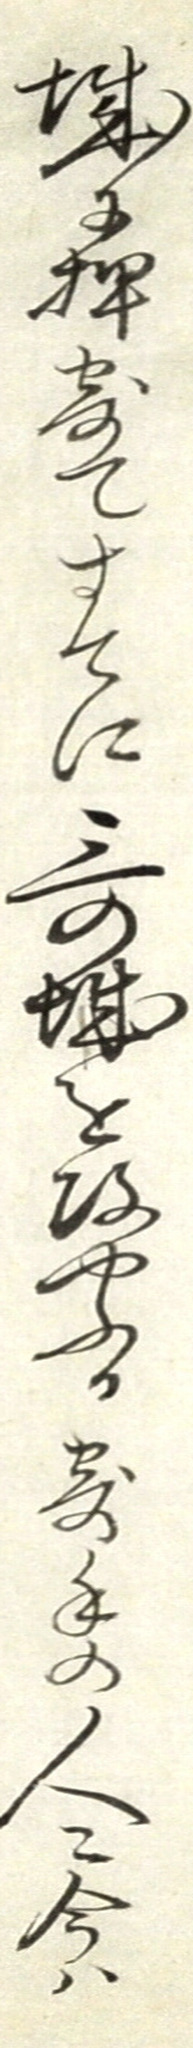城に押寄てすてに三の城を攻やふる寄手の人々今は
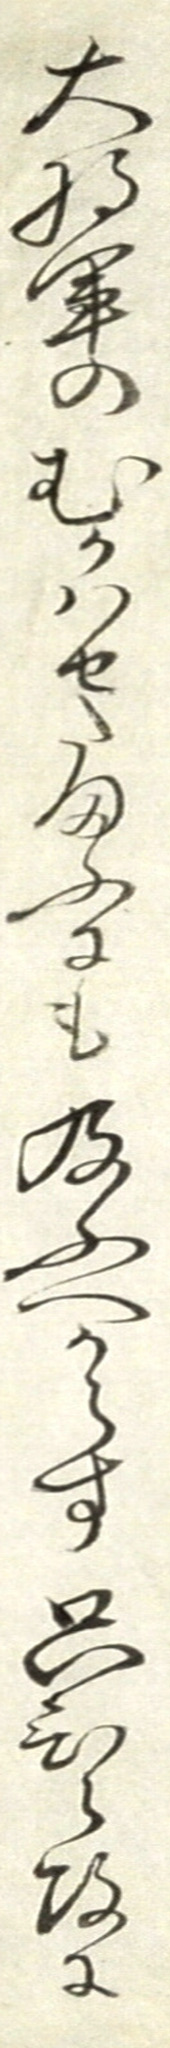大将軍のむかはせたまふにも及ふへからす只ひら攻に
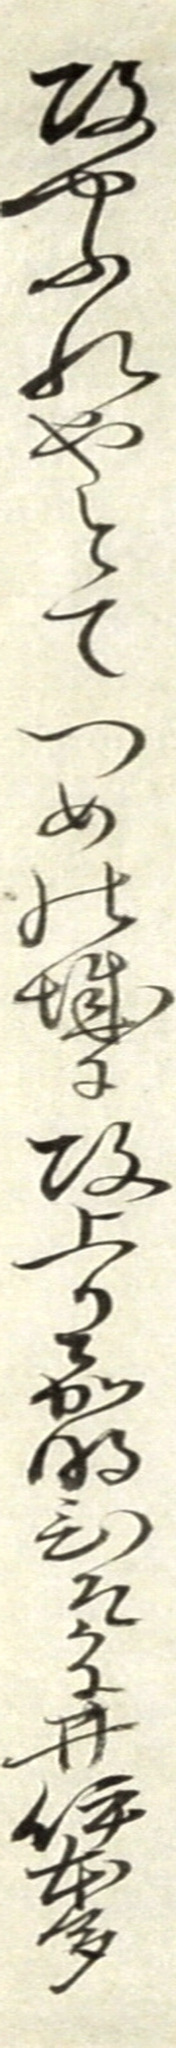攻やふれやとてつめの城に攻上り嘉明ひそかに井伊本多
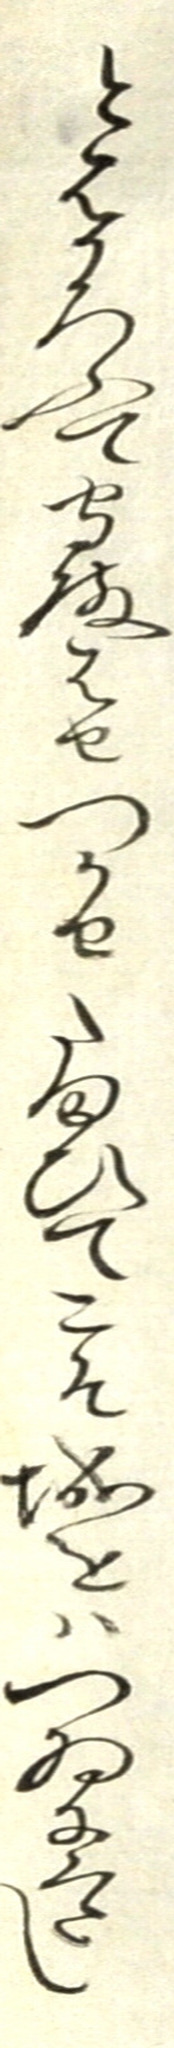とはかろふて守殿はせつかせたまひてこそ城をはつゐにくたし

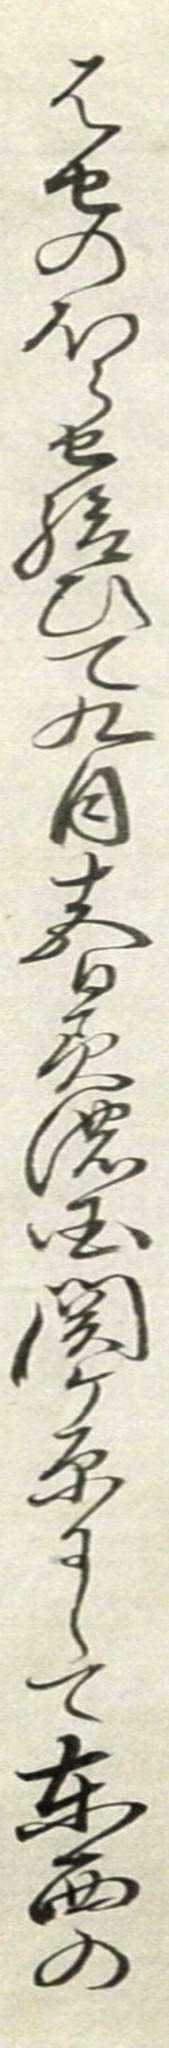はせのほらせ給ひて九月十五日美濃国関ヶ原にして東西の
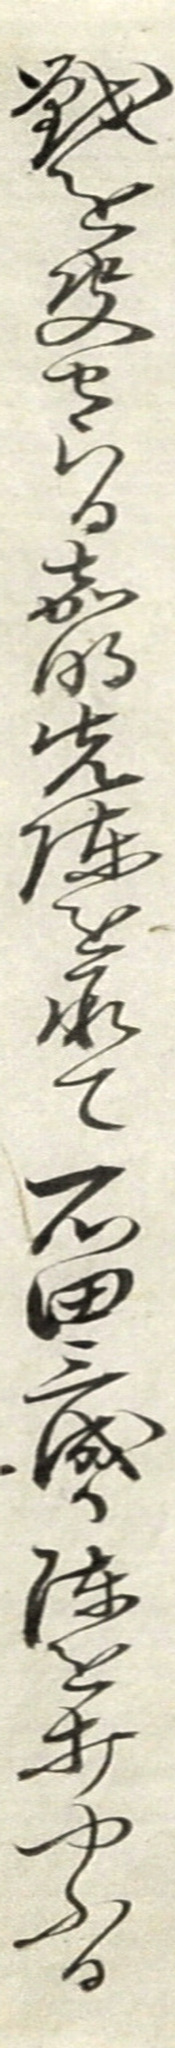戦を決せらる嘉明先陣を承て石田三成か陣を打やふる
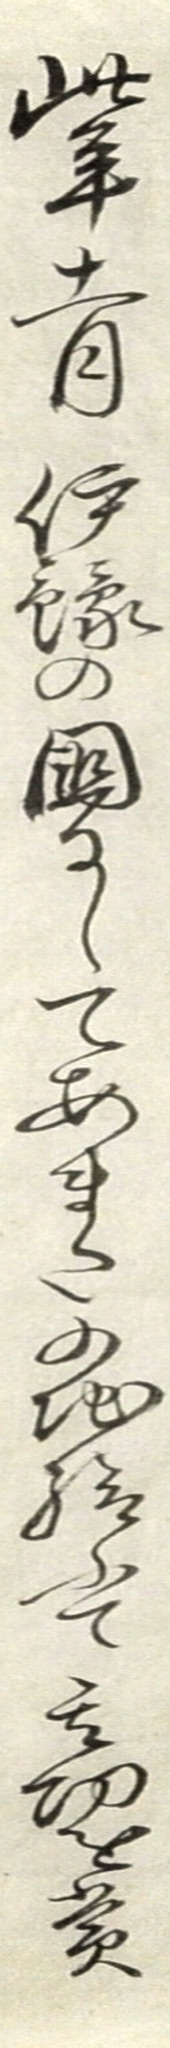此年十一月伊予の国にしてあまたの地給ふて其功を賞
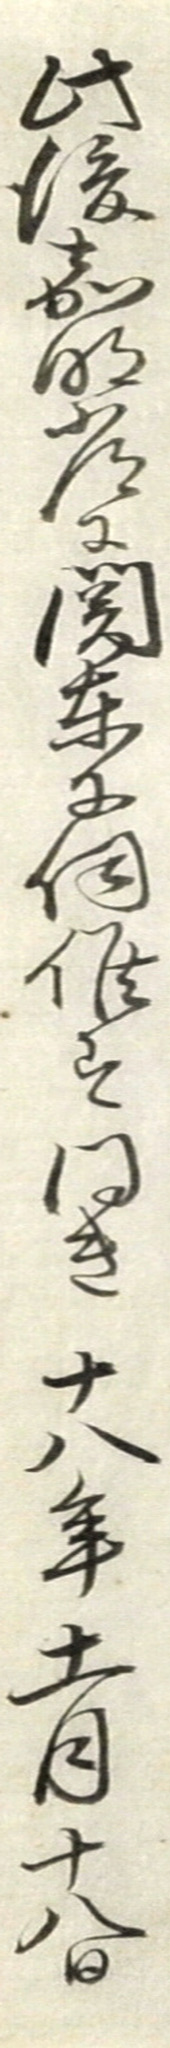此後嘉明常に関東に伺候す同き十八年十一月十八日
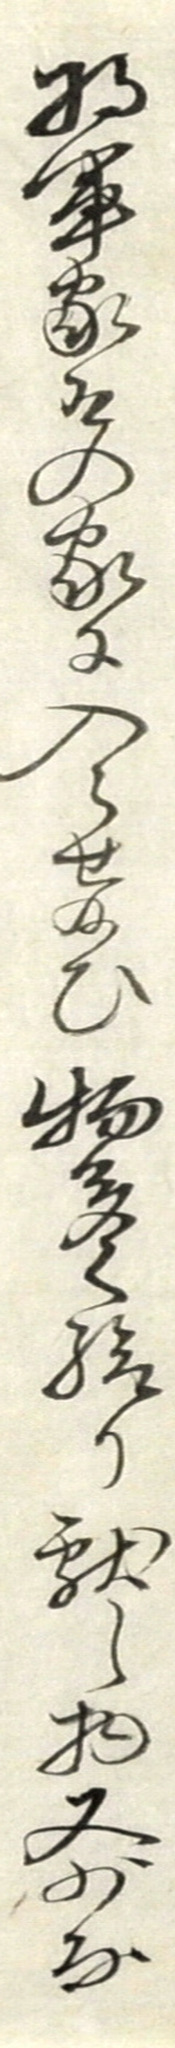将軍家その家に入らせ給ひ物多く給り献し物又少な
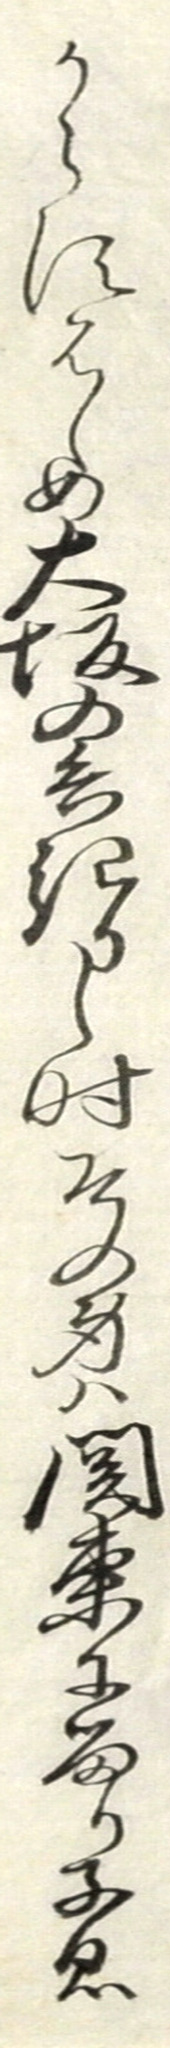からすはしめ大坂の兵起りし時その身は関東に留り子息
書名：藩翰譜（七・下）
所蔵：伊那市立高遠町図書館・合同会社AMANE
